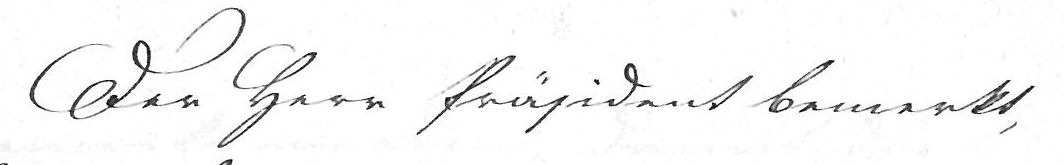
Der Herr Präsident bemerkt,
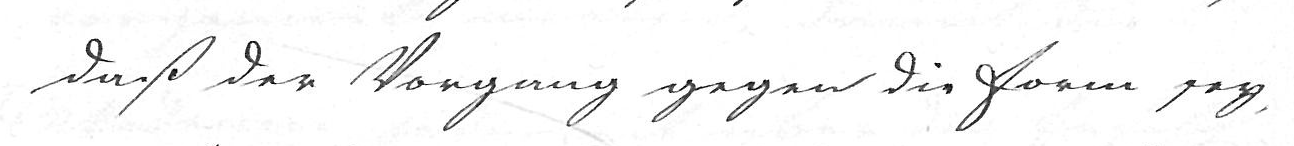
daß der Vorgang gegen die Form sey,
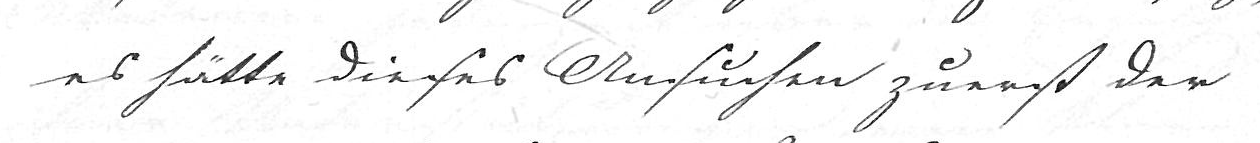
es hätte dieses Ansuchen zuerst der
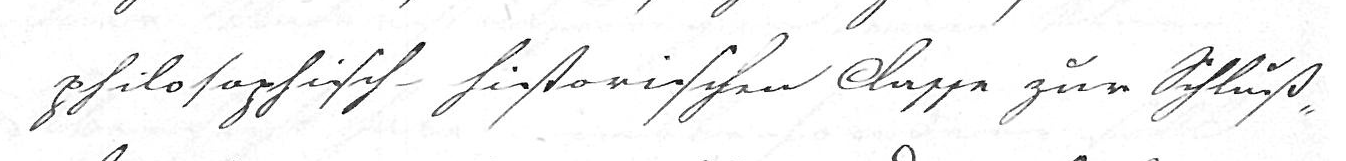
philosophisch-historischen Classe zur Schluß-
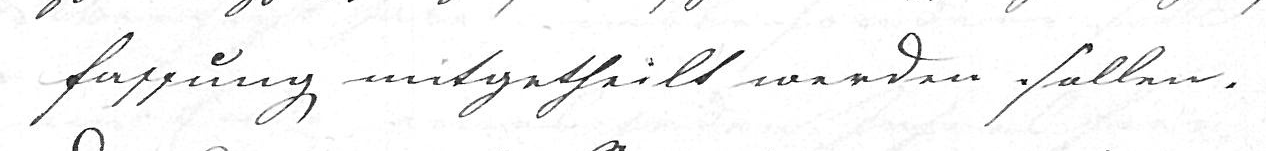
fassung mitgetheilt werden sollen.
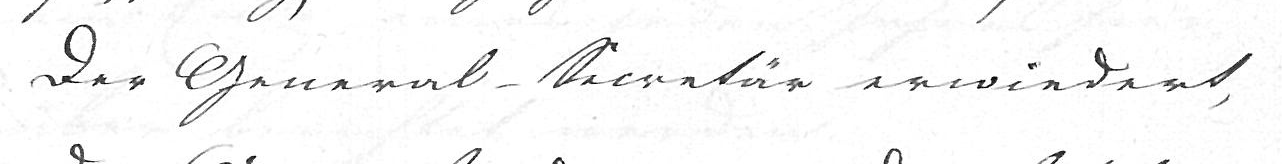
Der General-Secretär erwidert,
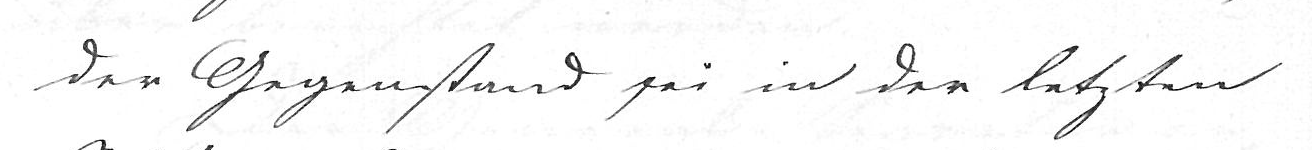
der Gegenstand sey in der letzten
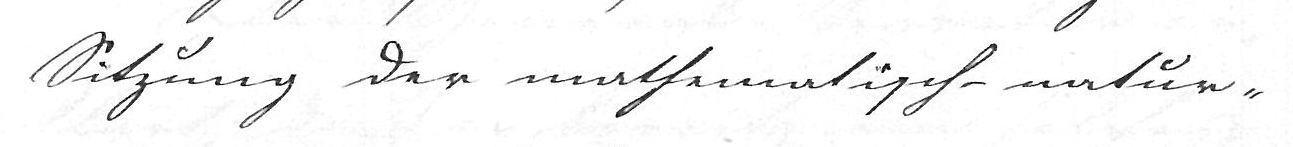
Sitzung der mathematisch-natur-
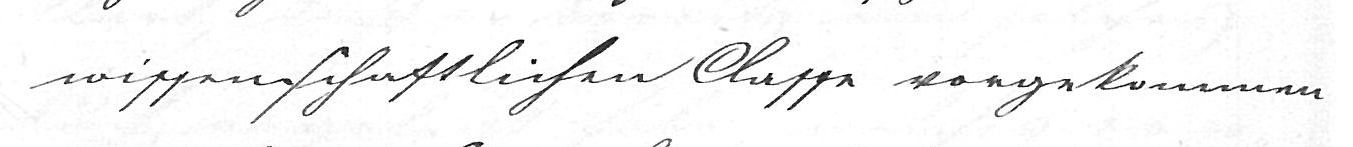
wissenschaftlichen Classe vorgekommen
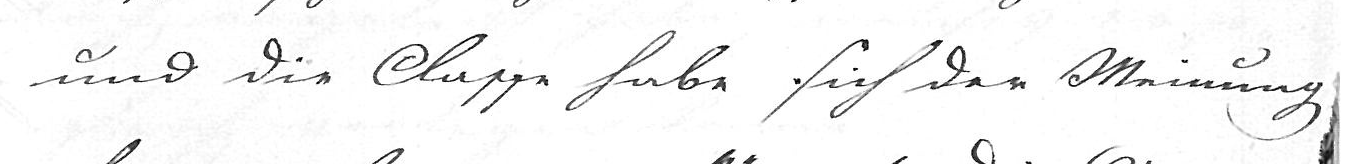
und die Classe habe sich der Meinung
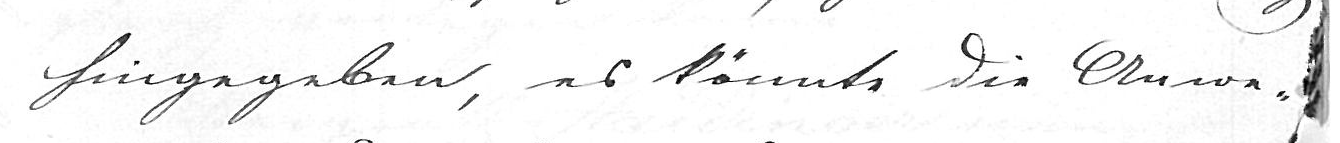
hingegeben, es könnte die Anwe-
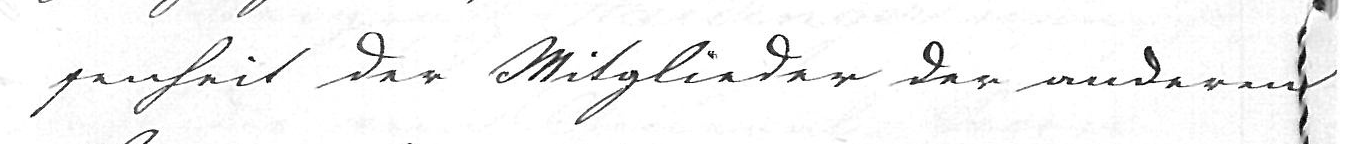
senheit der Mitglieder der anderen
